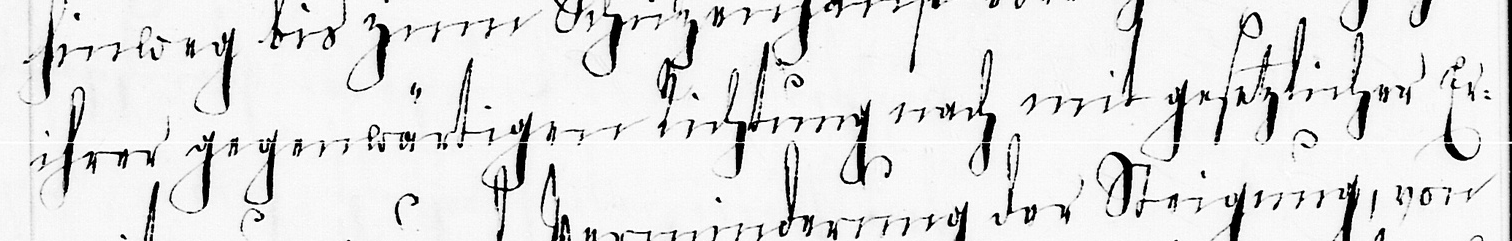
ihrer gegenwärtigen Richtung nach mit gesetzlicher Er¬
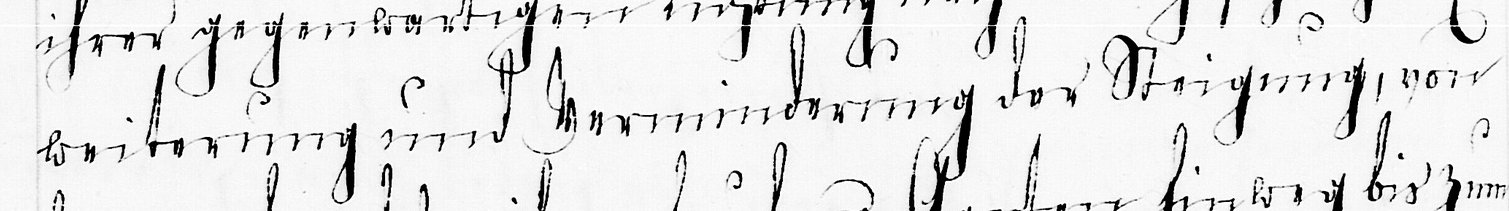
weiterung und Verminderung der Steigung, von
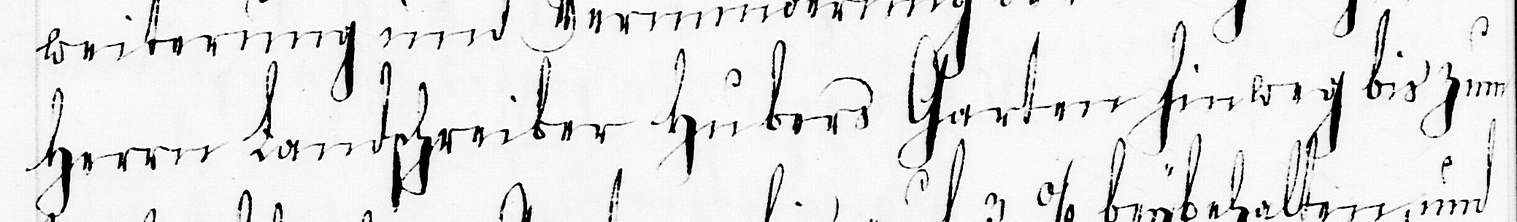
Herrn Landschreiber Hubers Garten hinweg bis zum
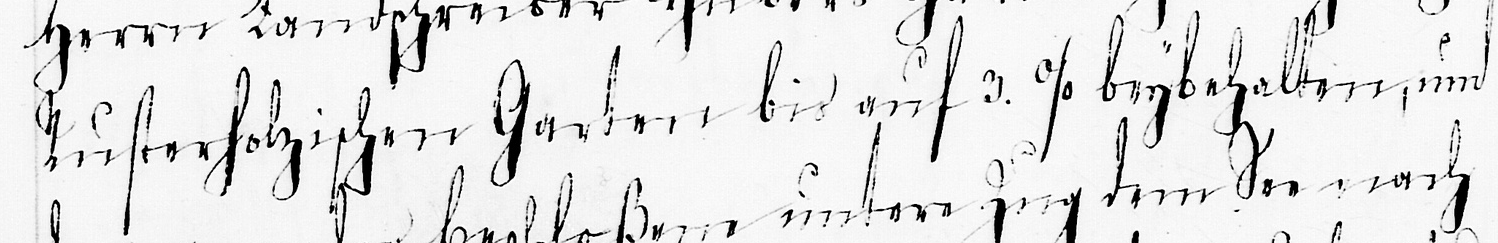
Rusterholzischen Garten bis auf 3. % beybehalten, und
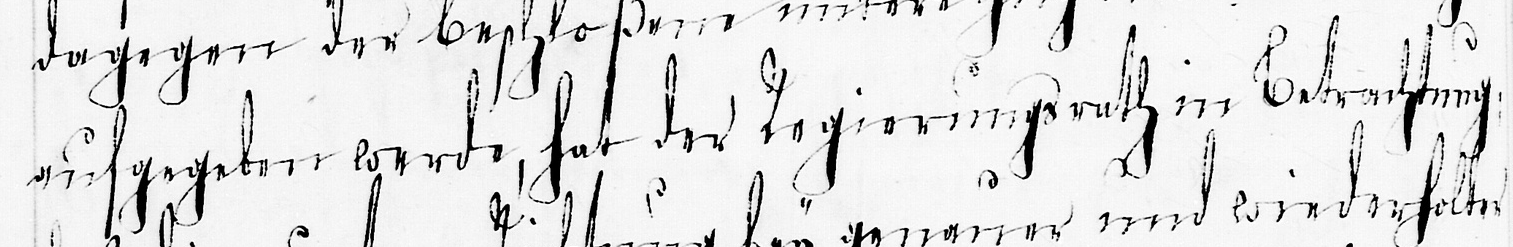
aufgegeben werde, hat der Regierungsrath in Betrachtun¬
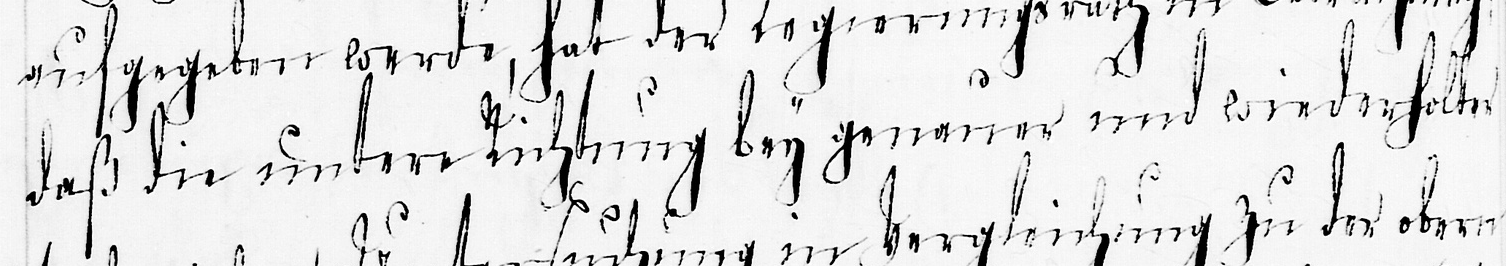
daß die untere Richtung bey genauer und wiederholt¬
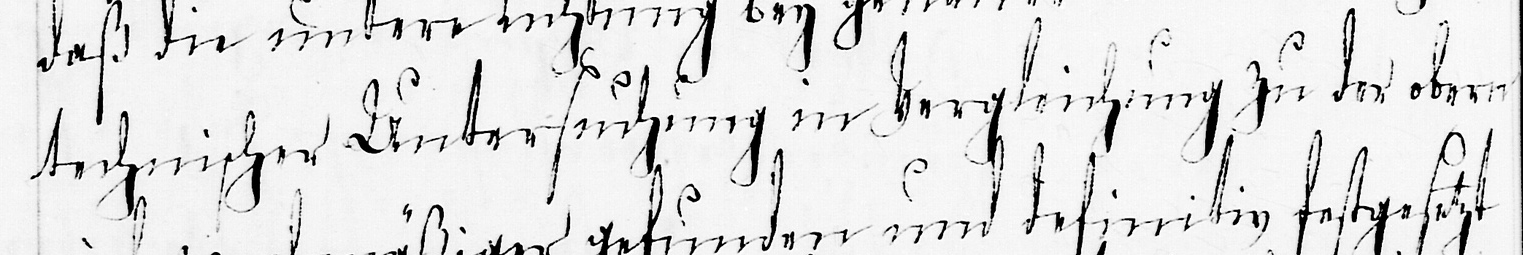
technischer Untersuchung in Vergleichung zu der obern
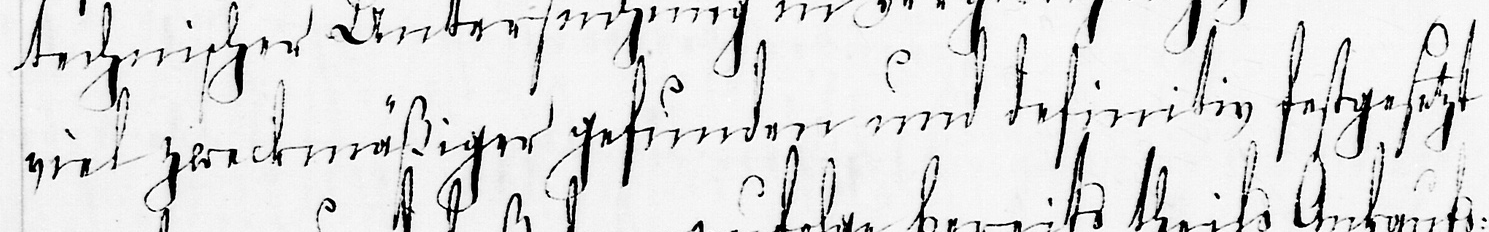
viel zweckmäßiger gefunden und definitiv festgesetzt
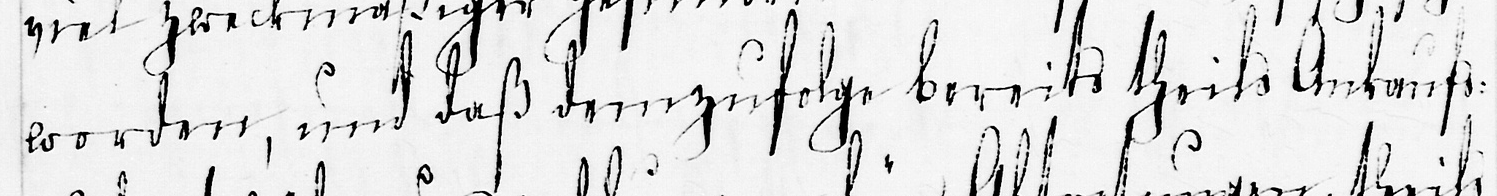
worden, und daß demzufolge bereits theils Ankaufs-
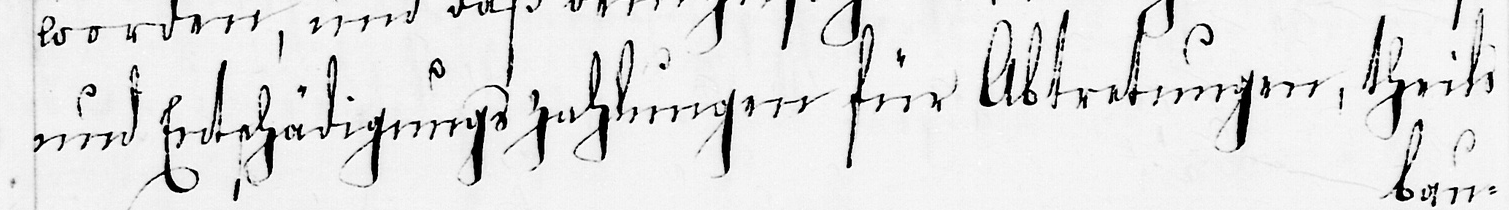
und Entschädigungszahlungen für Abtretungen, theils
